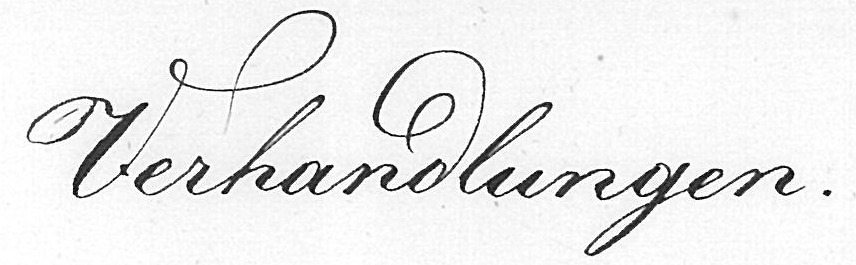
Verhandlungen.
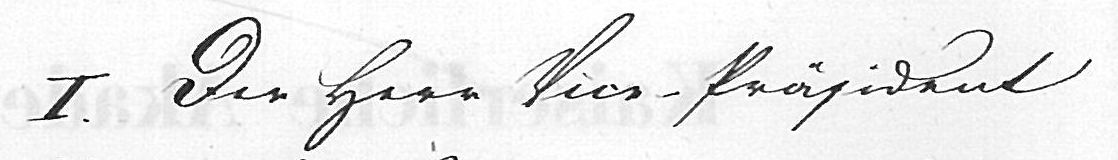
I. Der Herr Vice-Präsident
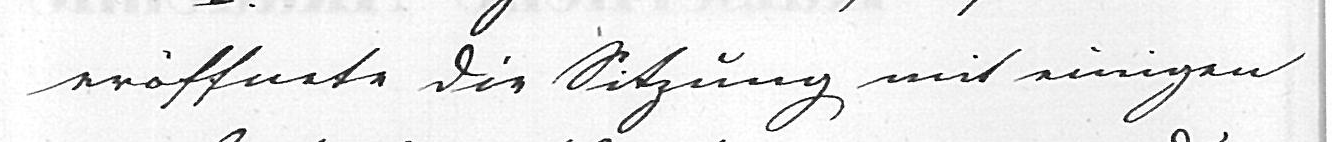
eröffnete die Sitzung mit einigen
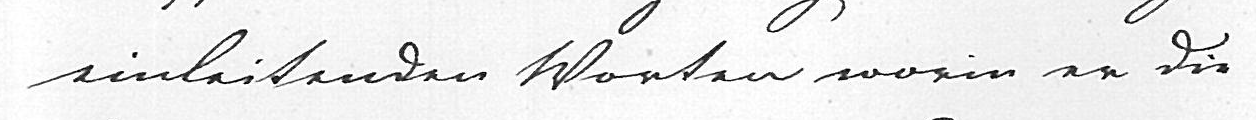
einleitenden Worten worin er die
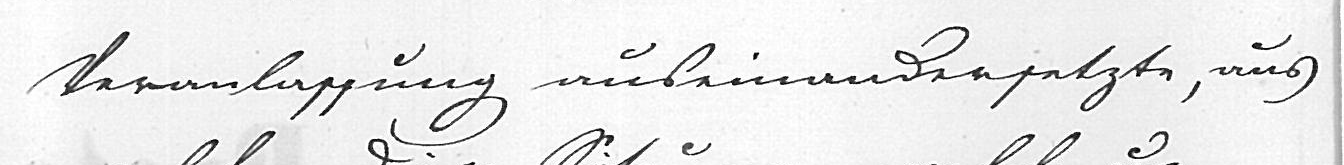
Veranlassung auseinandersetzte, aus
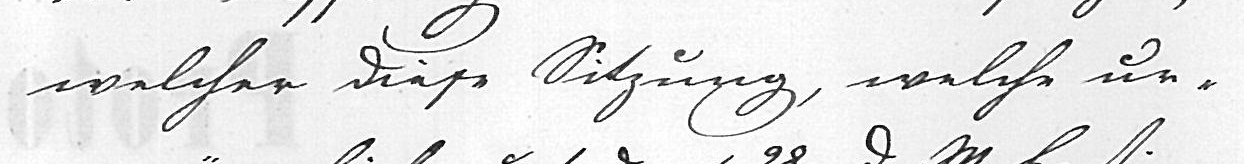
welcher diese Sitzung, welche ur-
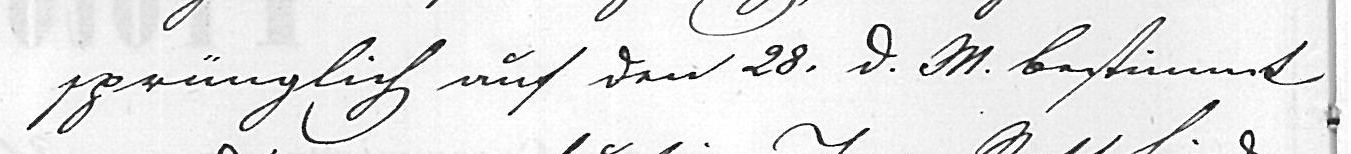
sprünglich auf den 28. d. M. bestimmt
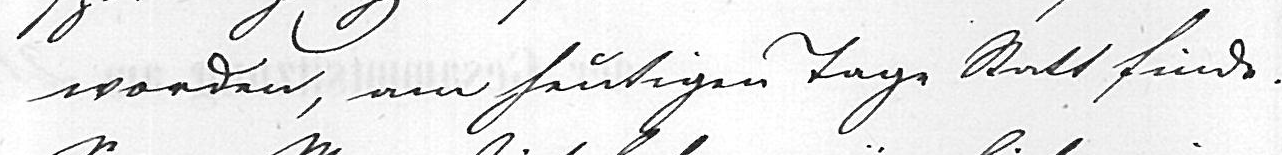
worden, am heutigen Tage Statt finde.
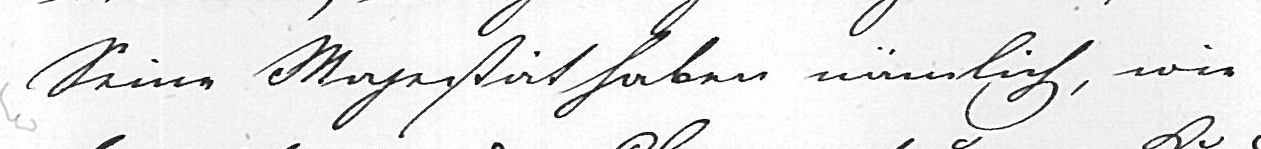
Seine Majestät haben nämlich, wie
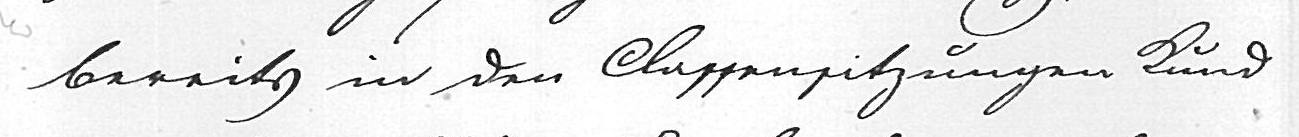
bereits in den Classensitzungen Kund
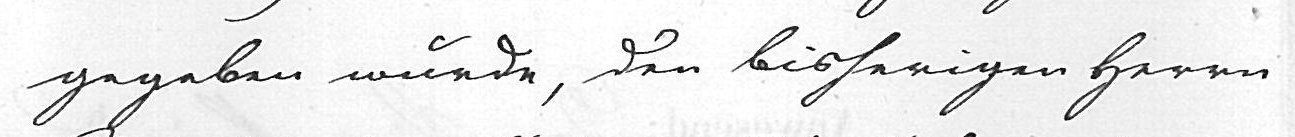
gegeben wurde, den bisherigen Herrn
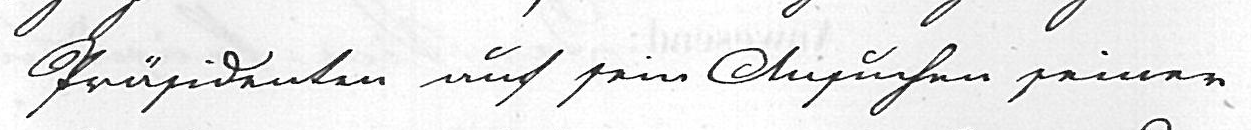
Präsidenten auf sein Ansuchen seiner
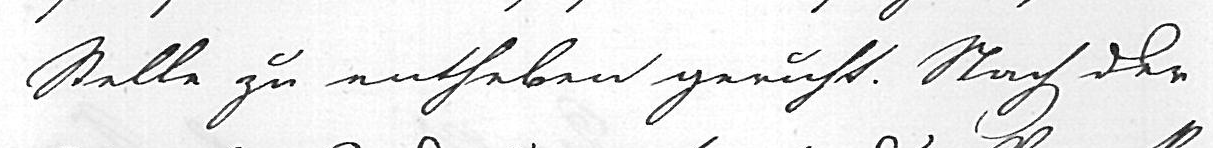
Stelle zu entheben geruht. Nach der
